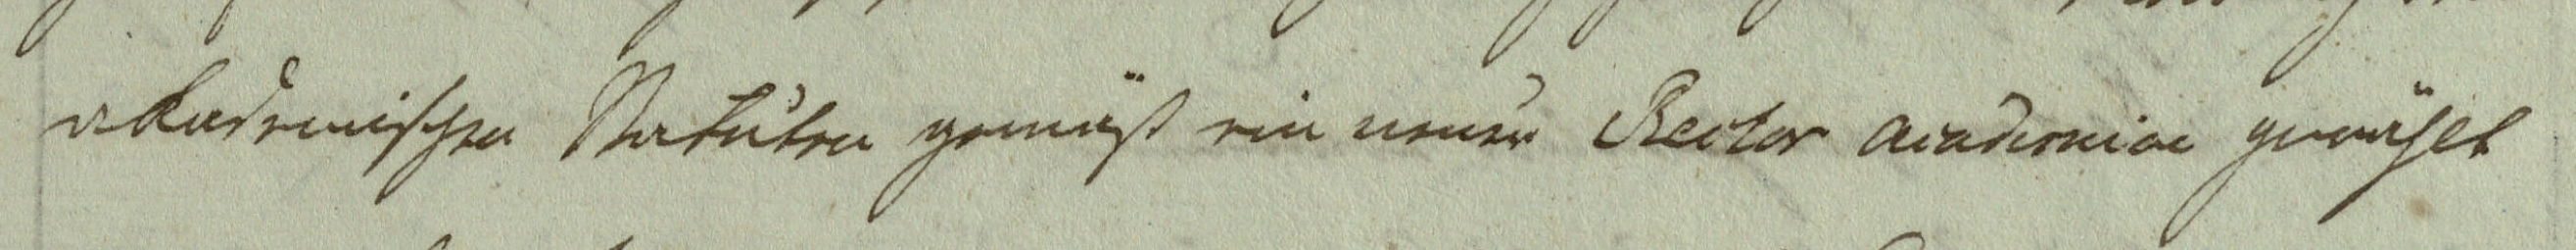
akademischen Statuten gemäß ein neuer Rector Academiae gewählt
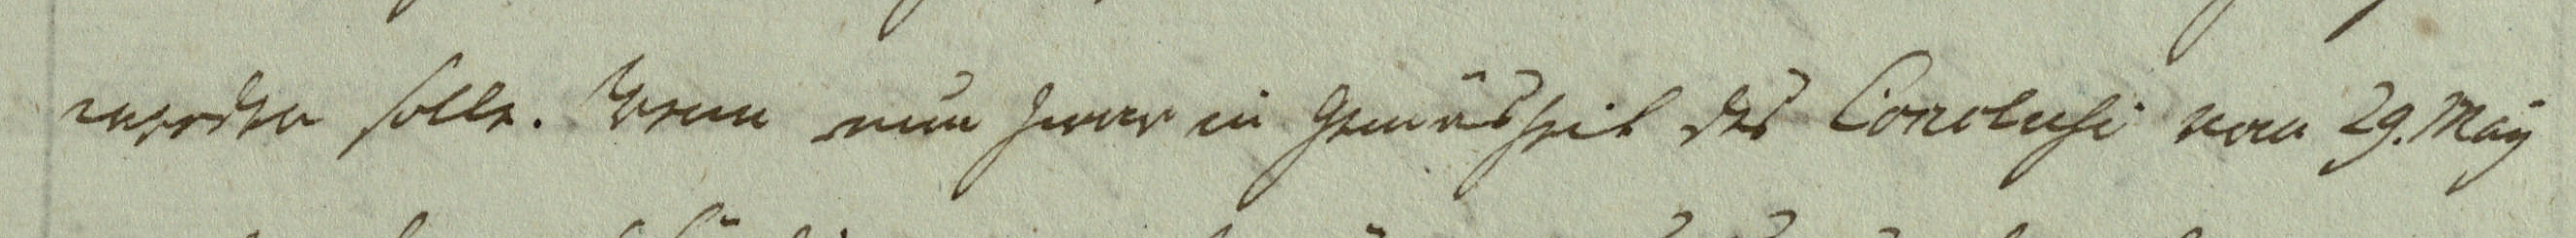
werden solle. Wenn nun zwar in Gemäsheit des Conclusi vom 29. Maÿ
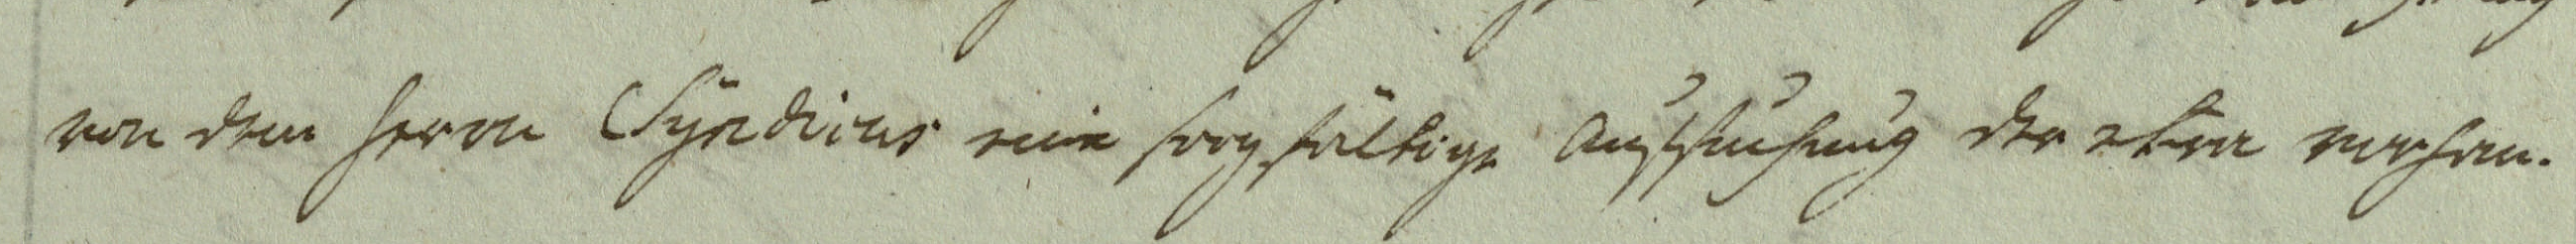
von dem herrn Sÿndicus eine sorgfältige Aufsuchung der etwa vorhan¬
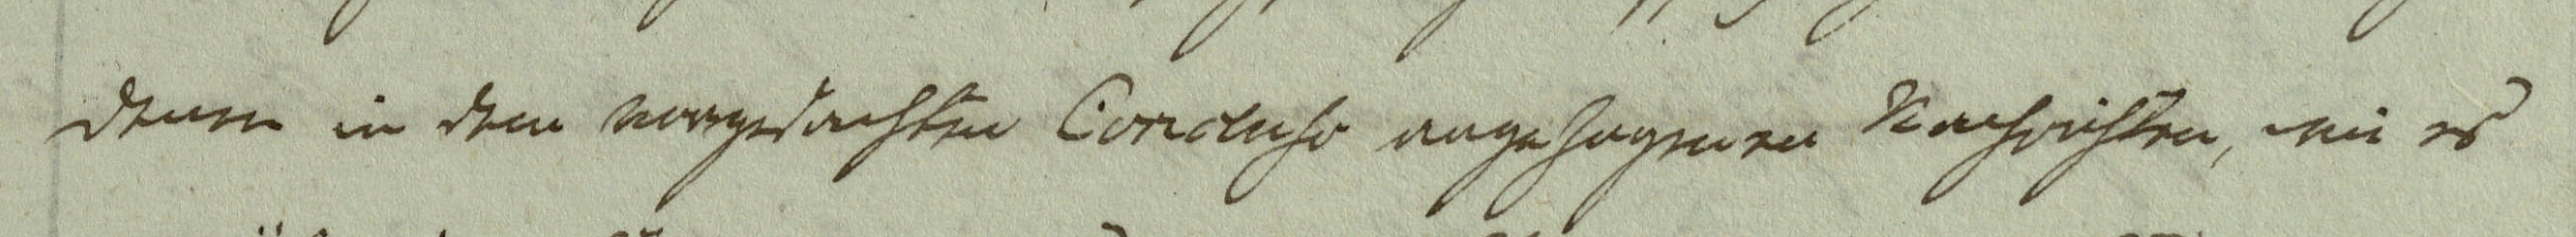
denen in dem vorgedachten Concluso angezogenen Nachrichten wie es
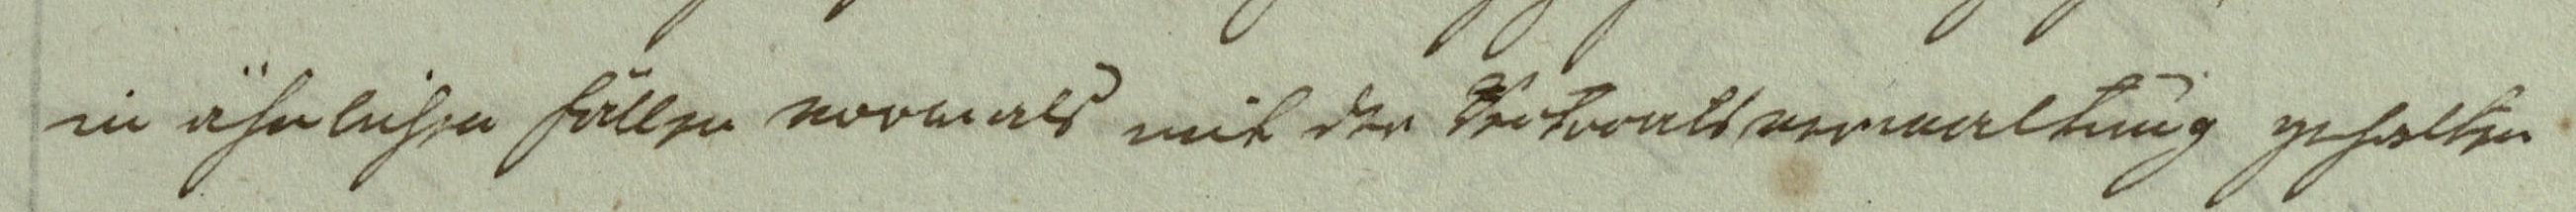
in ähnlichen Fällen vormals mit der Rectoratsverwaltung gehalten
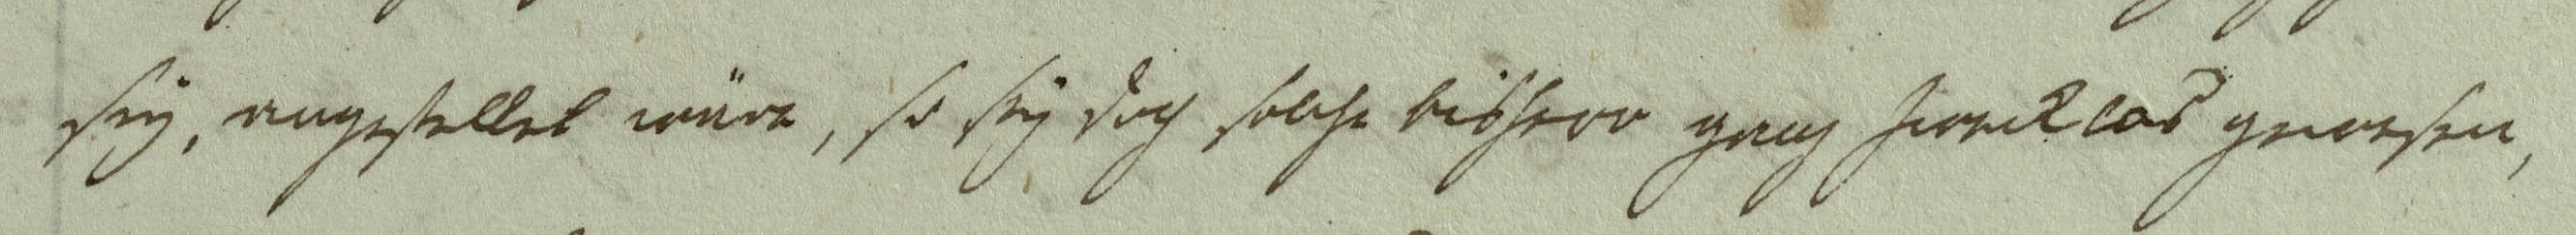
seÿ, angestellet wäre, so seÿ doch solche bisher ganz zwecklos gewesen,
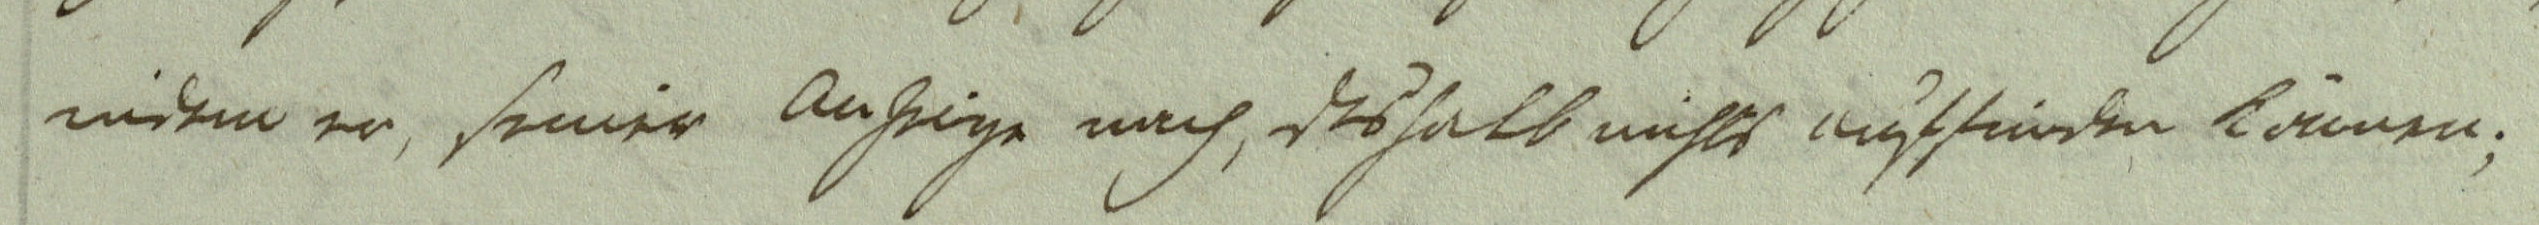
indem er, seiner Anzeige nach, deshalb nichts auffinden können;
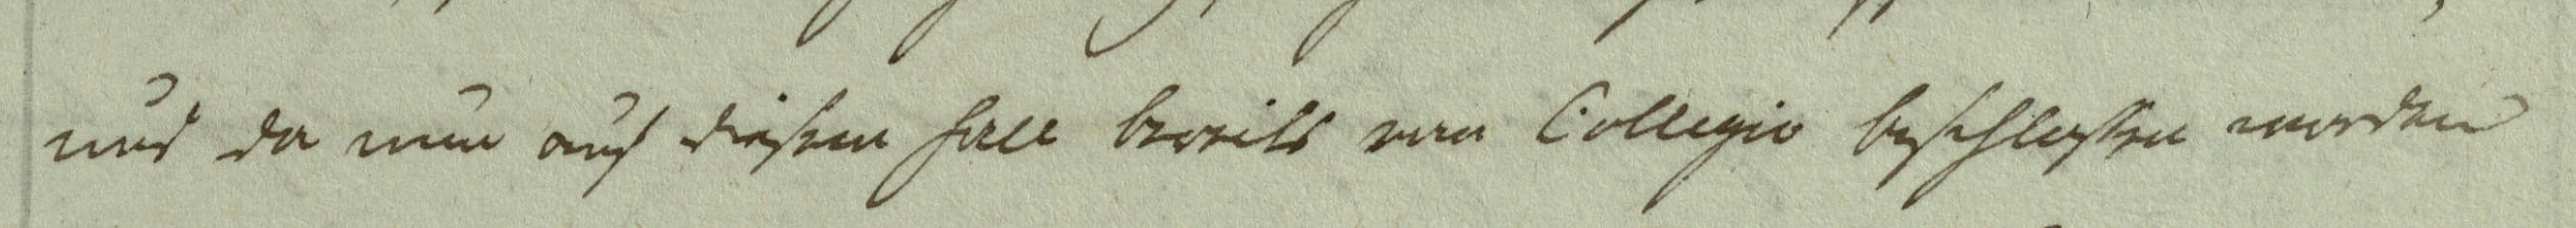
und da nun auf diesem Fall bereits vom Collegio beschlossen worden
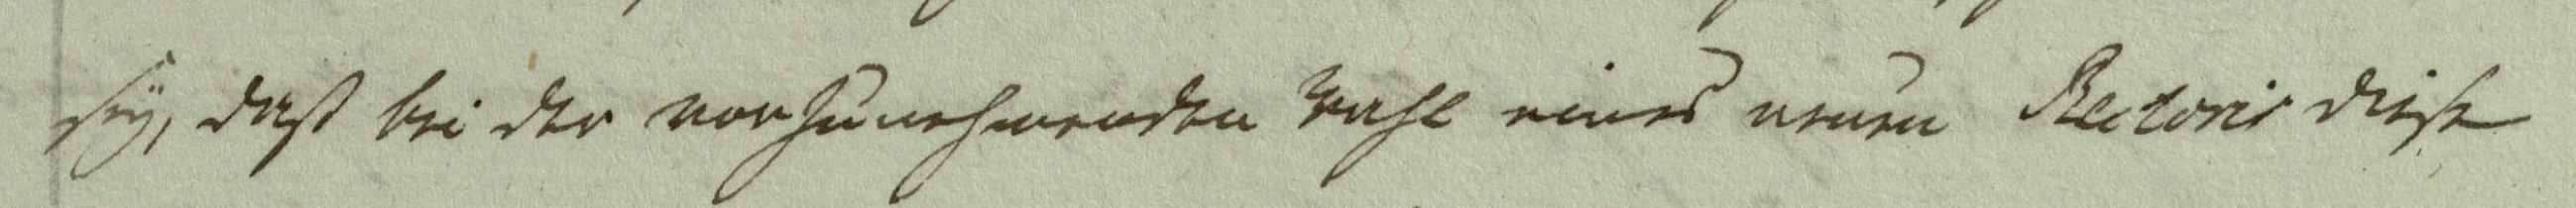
seÿ, daß bei der vorzunehmenden Wahl eines neuen Rectoris diese
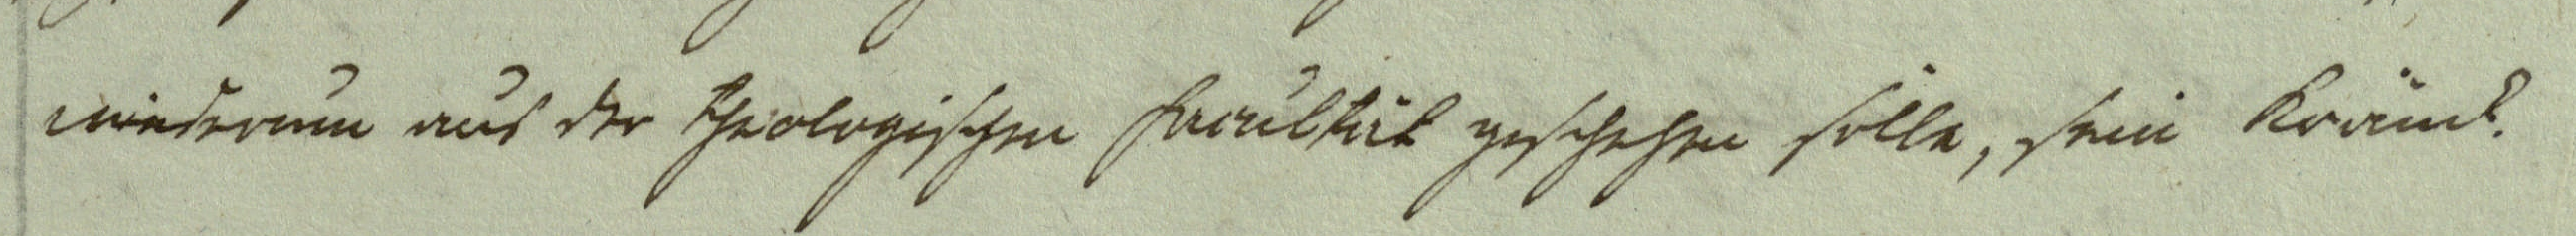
wiederum aus der Theologischen Facultät geschehen solle, sein kränck¬
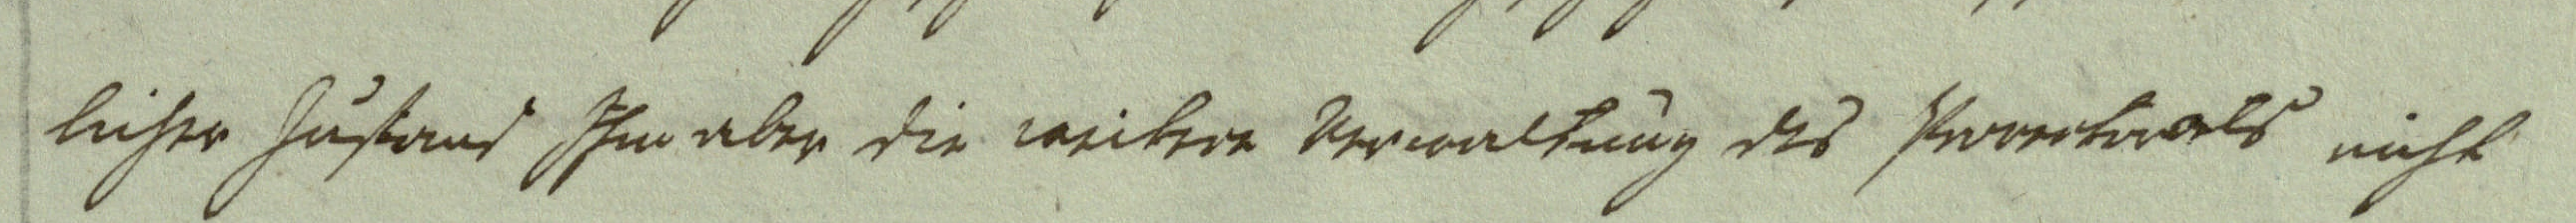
licher Zustand Ihm aber die weitere Verwaltung des Prorectorats nicht
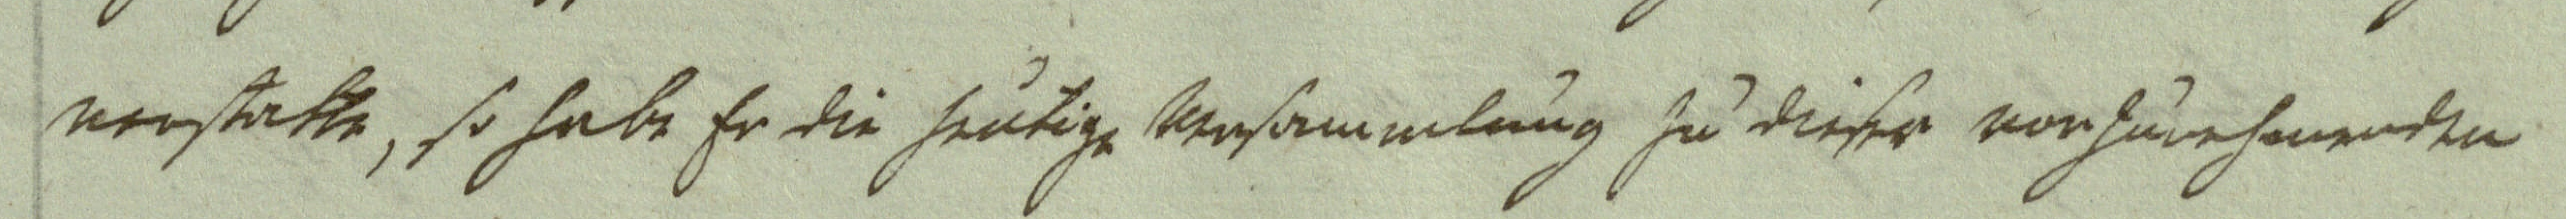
verstatte, so habe Er die heutige Versammlung zu dieser vorzunehmenden
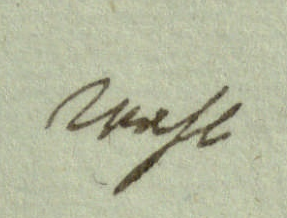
Wahl
